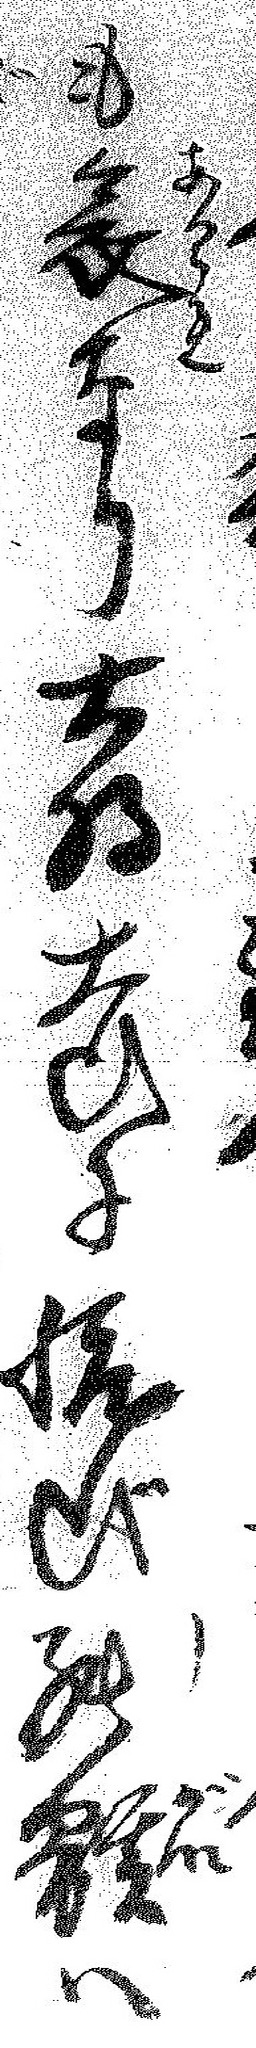も哀なり大将大ひに悦び死骸は
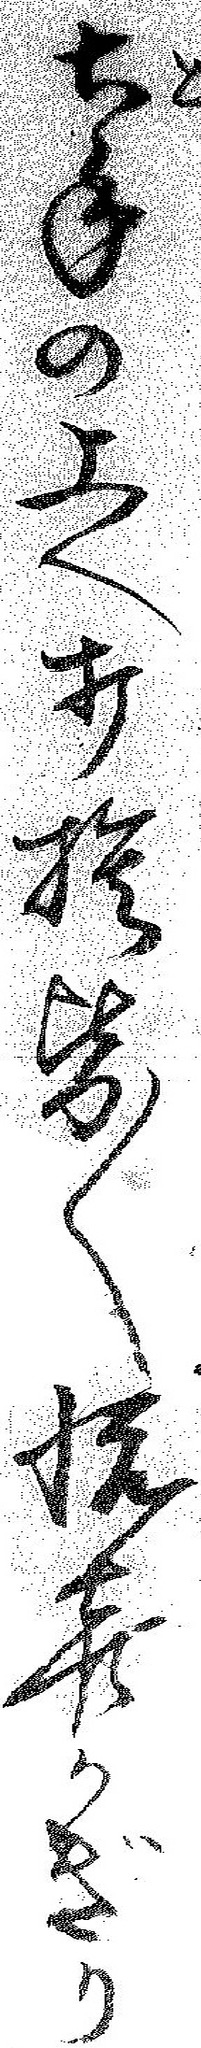土手の上へ打捨皆〳〵悦喜かぎり
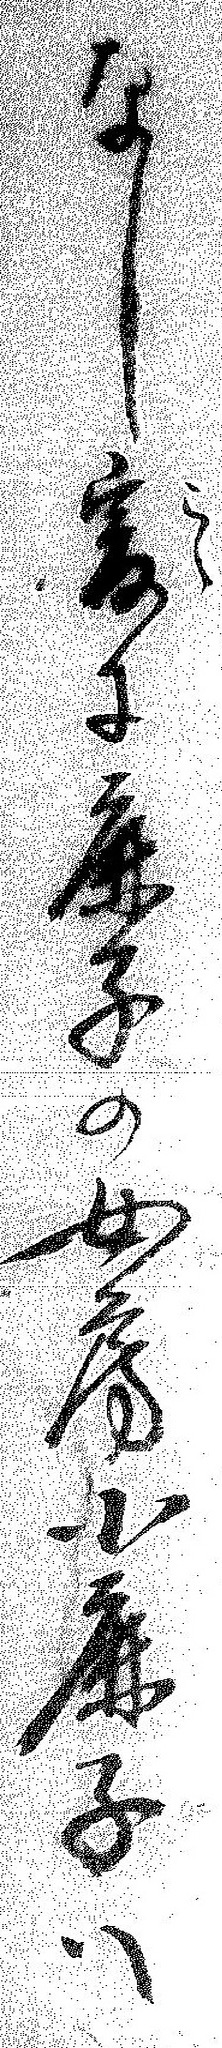なし爰に鹿子の女房小鹿子は

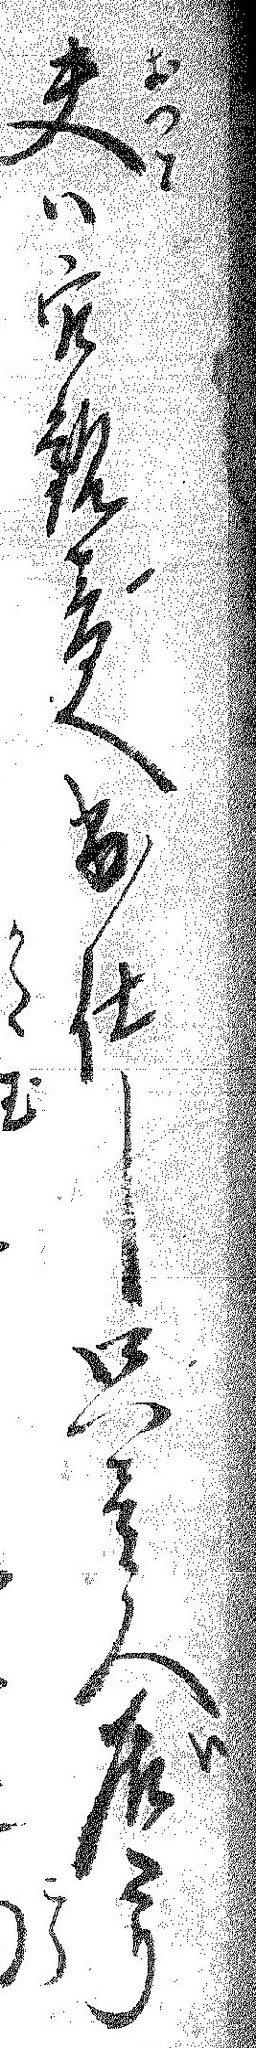夫は穴観音へ出仕し只壱人居たり
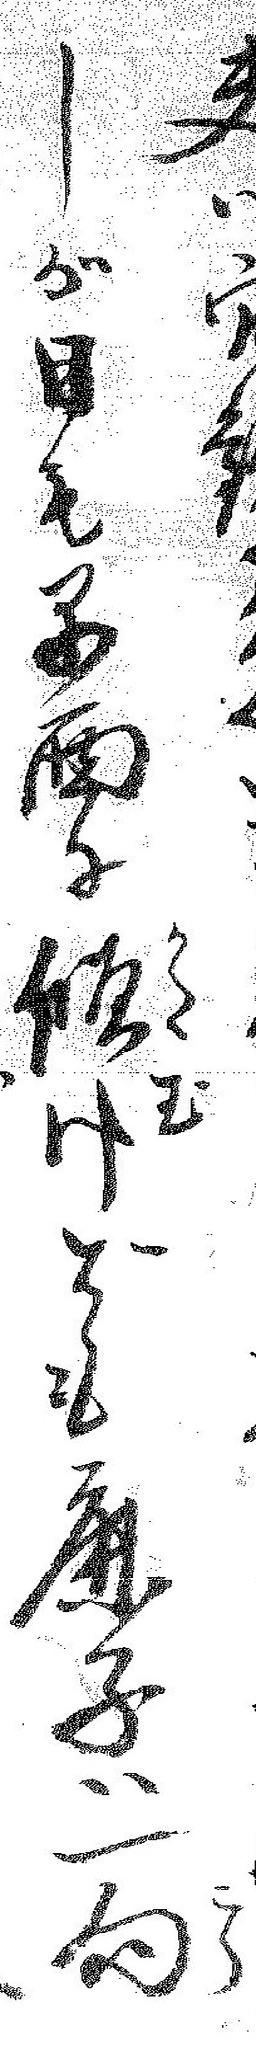しが日も早西に傾むけども鹿子は一向
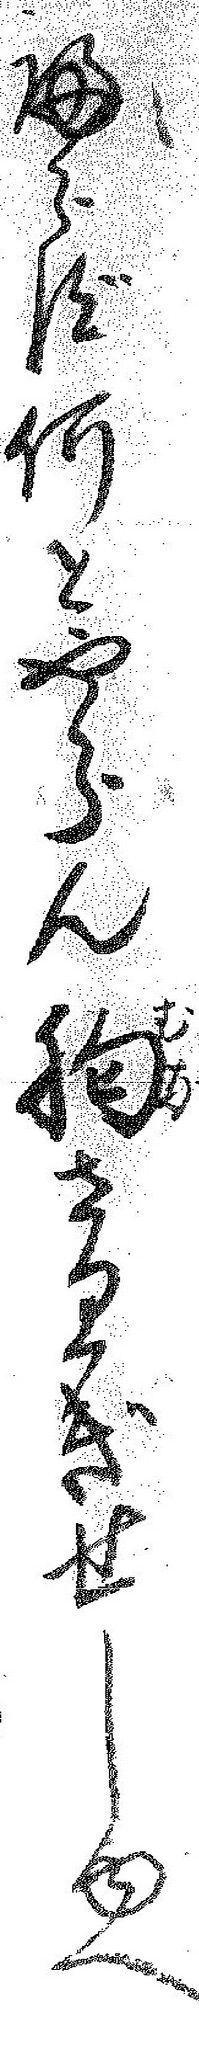帰らず何とやらん胸さわぎせしゆへ
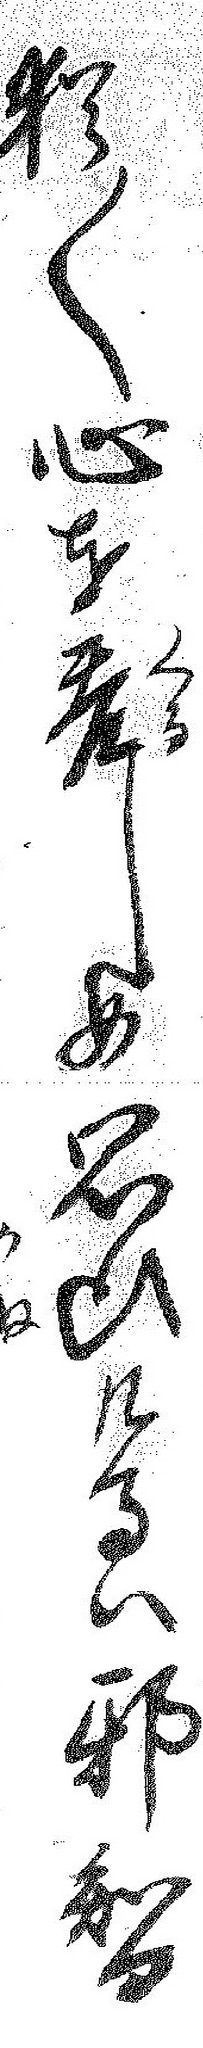猶〳〵心を苦しめ思ひけるは邪智
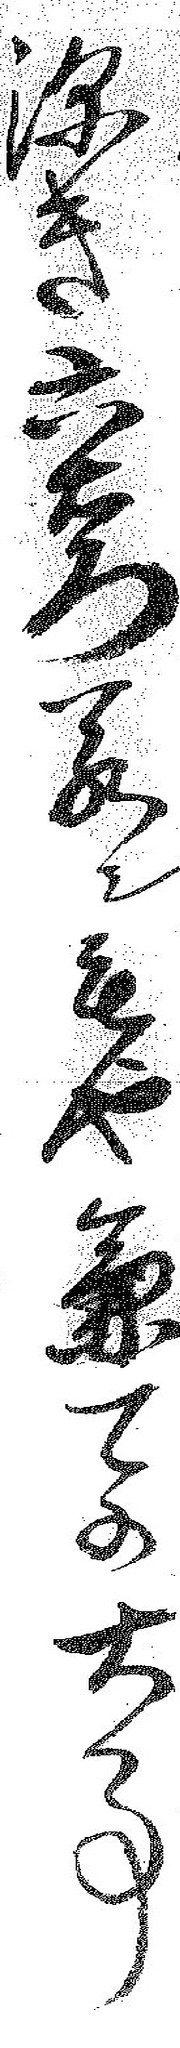深き六右衛門若しもや兼ての大事
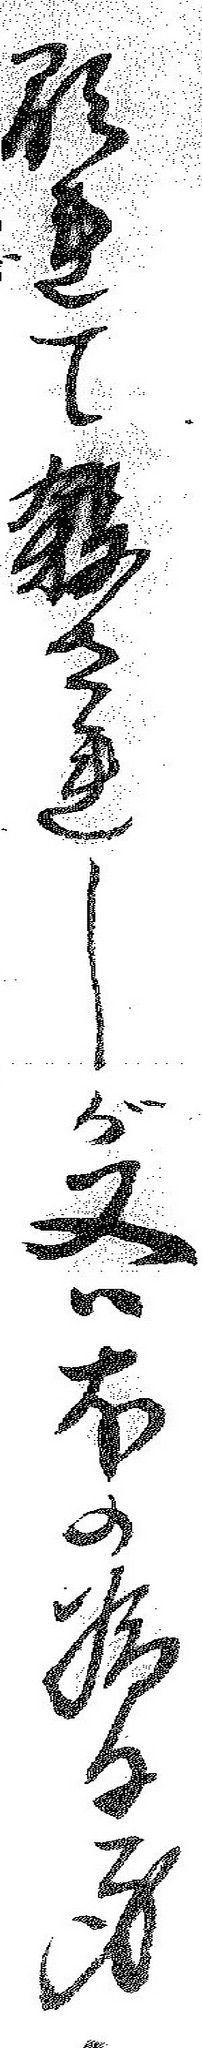顕れて殺されしが又はの為に身
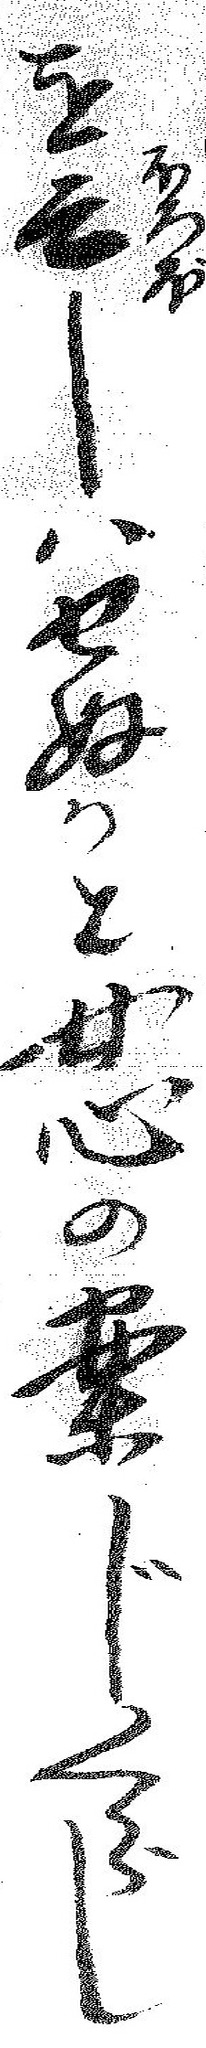を亡しはせぬかと女心の案じくらし
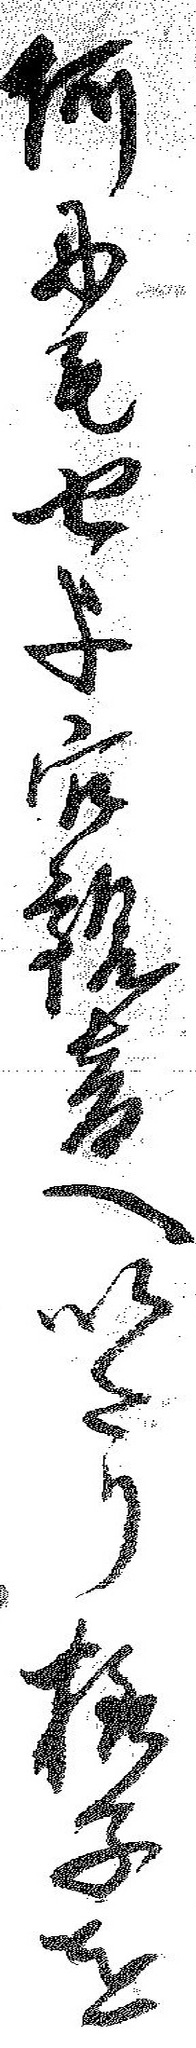何にもせよ穴観音へいたり様子を
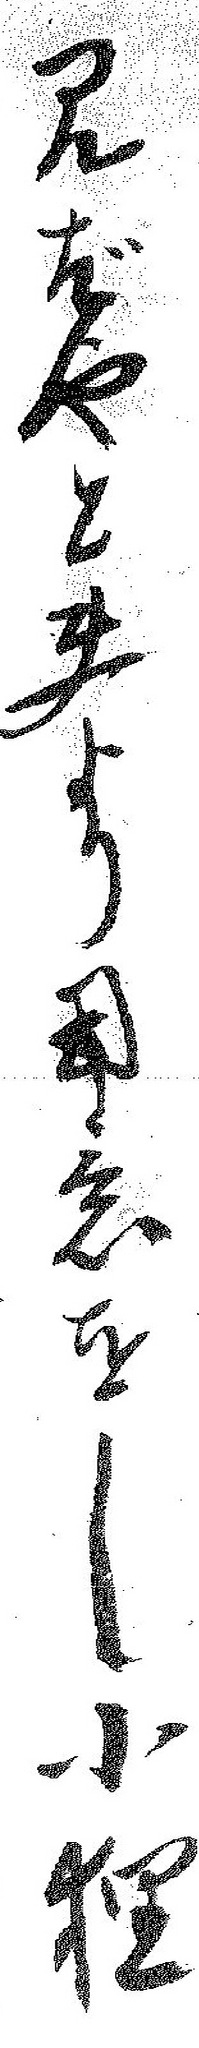見ばやと夫より用意をし小狸
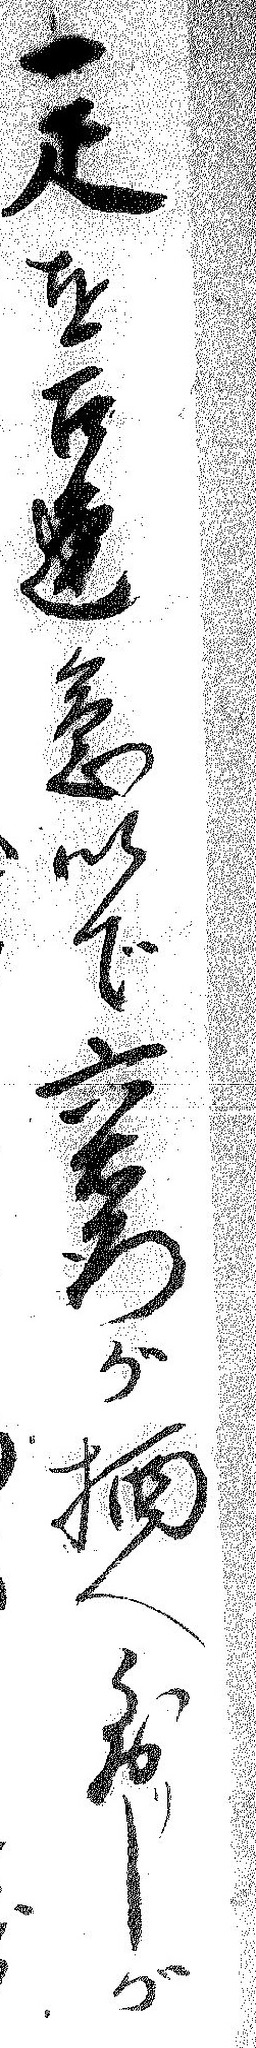一疋を召連急いで六右衛門が栖へ至りしが
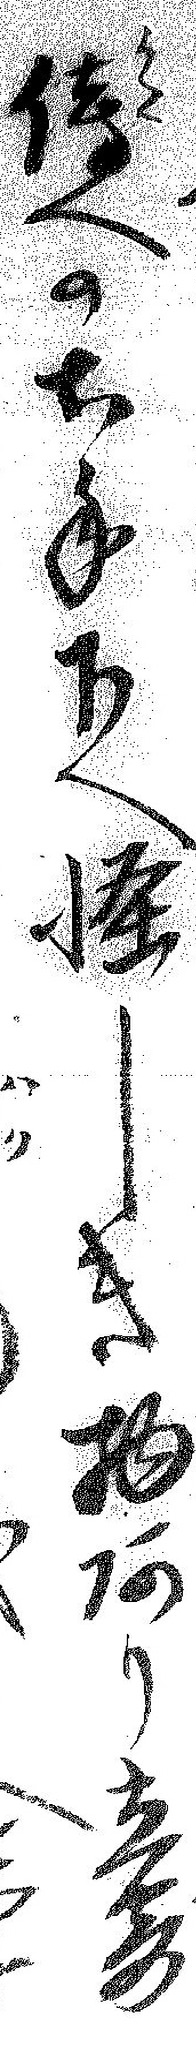傍へか土手下へ怪しき物あり立寄
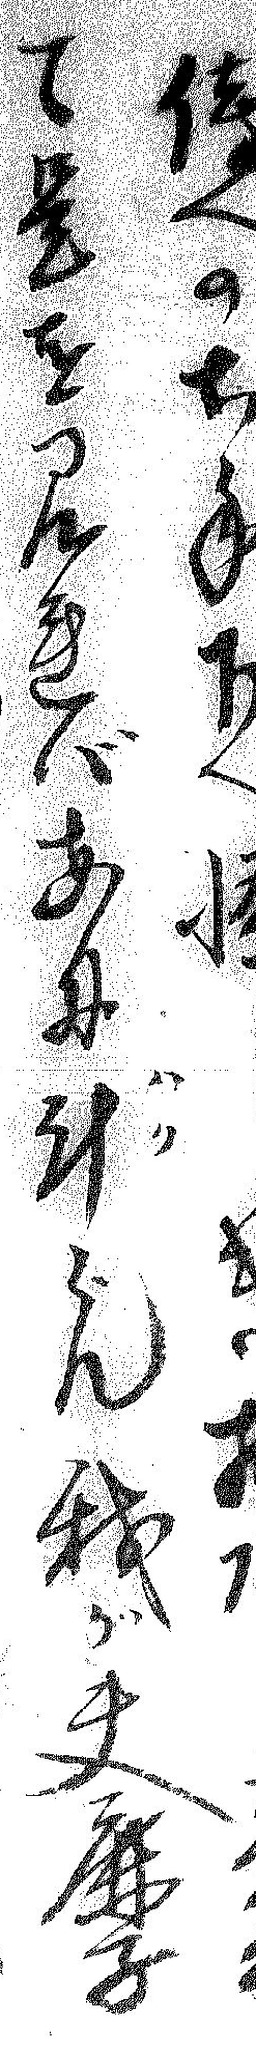て是を見ればあに計らん我が夫鹿子
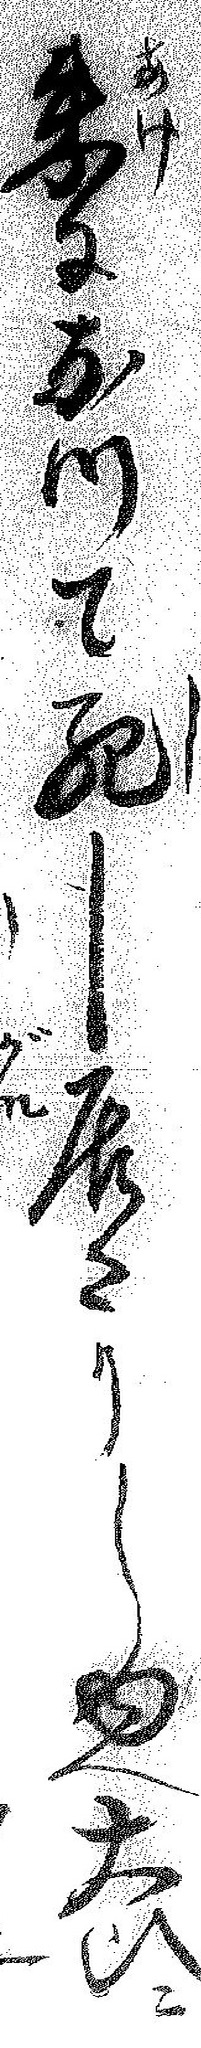朱になつて死し居たりしゆへ大ひに
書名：近頃古狸珍説　礼義智信
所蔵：徳島県立図書館
